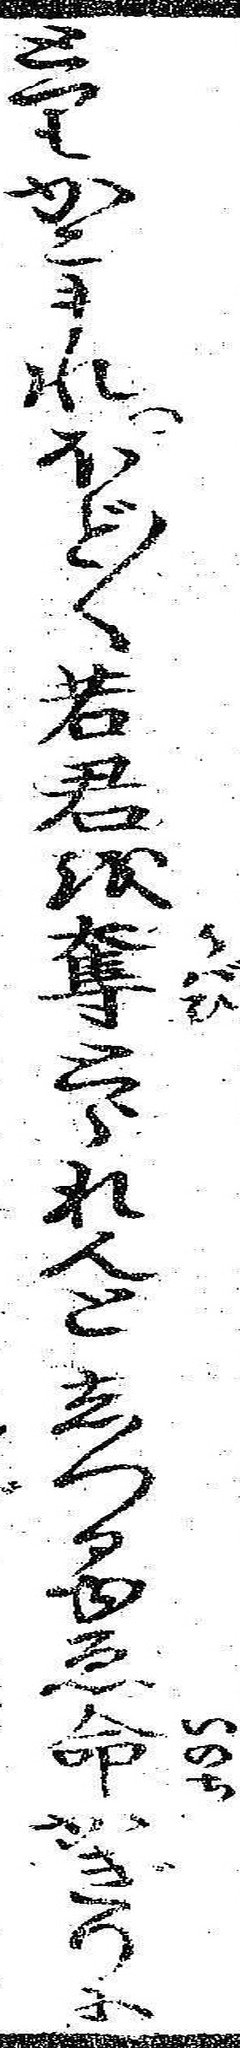とりかこまれ。ほど〳〵若君を奪とられんとしつるゆゑ命かぎりに
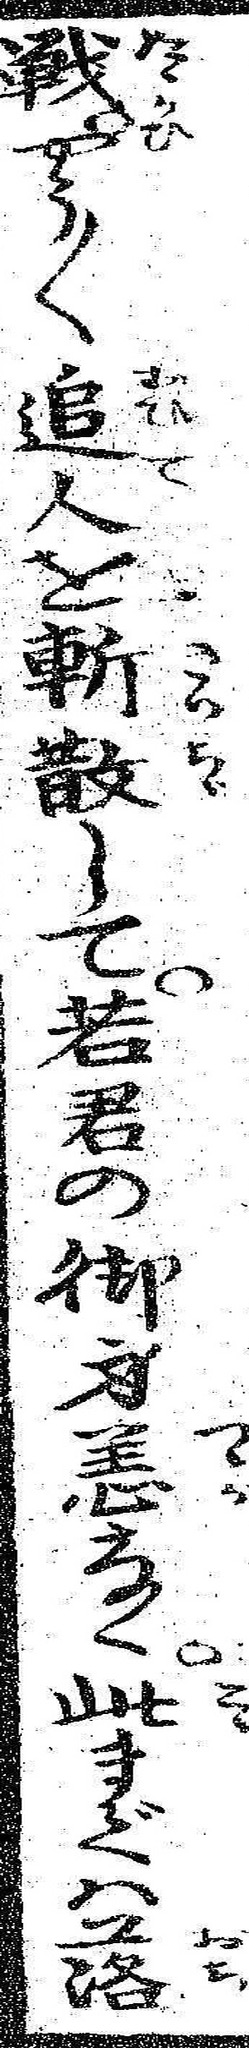戦。やう〳〵追人を斬散して。若君の御身恙なく。此までは落
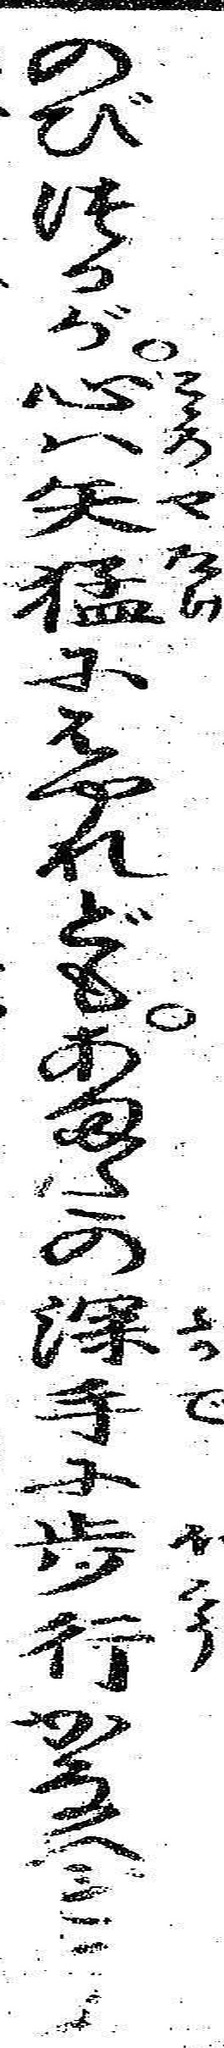のびつるが。心は矢猛にはやれども。あまたの深手に歩行かなはずと
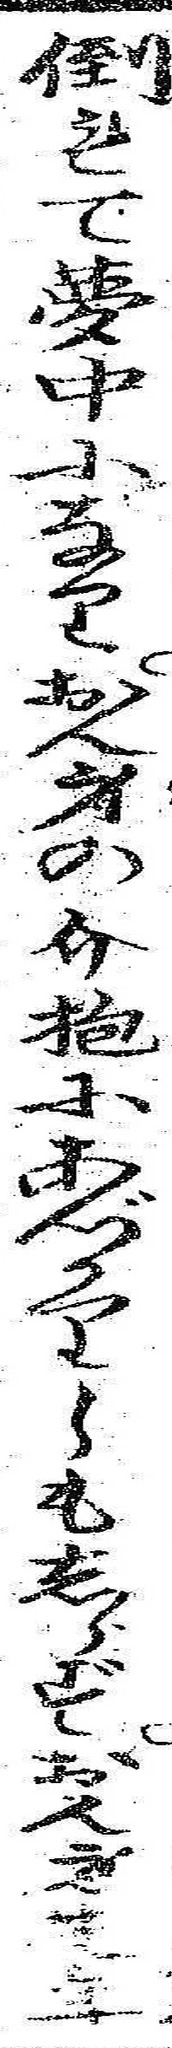倒れて夢中になり。おん身の介抱にあづかりしもしらず。おん身先年
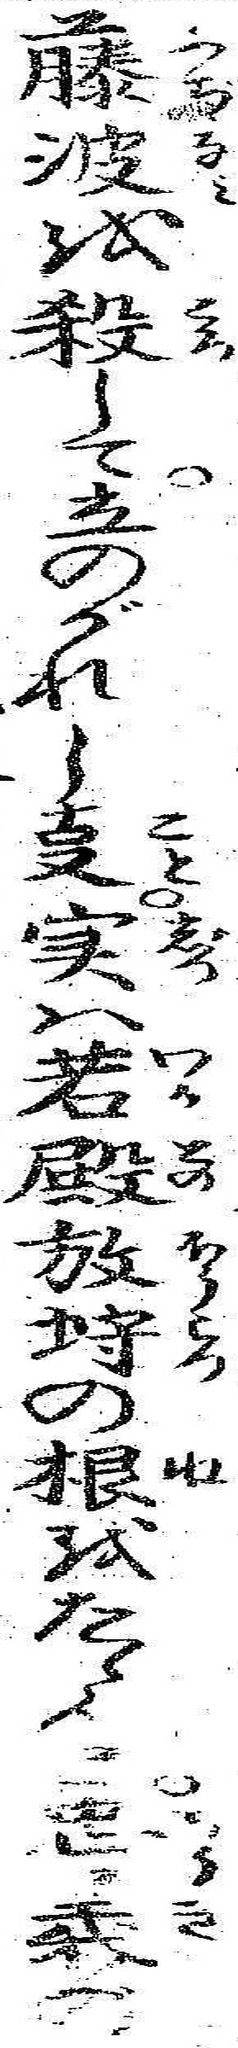藤波を殺して。立のがれし事。実は若殿放埒の根をたゝんと。忠義の
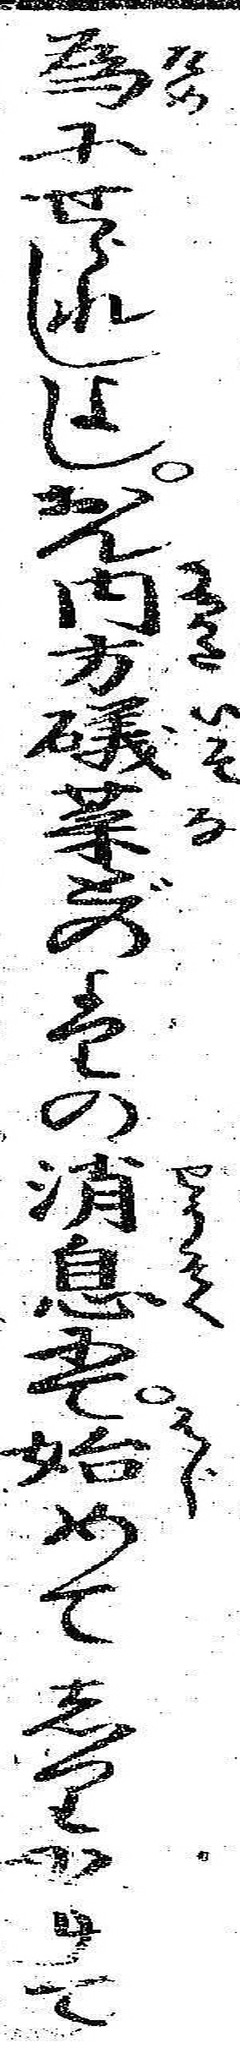為にせらしれよし。おん内方礒菜どのよりの消息にて。始めてしりかねて
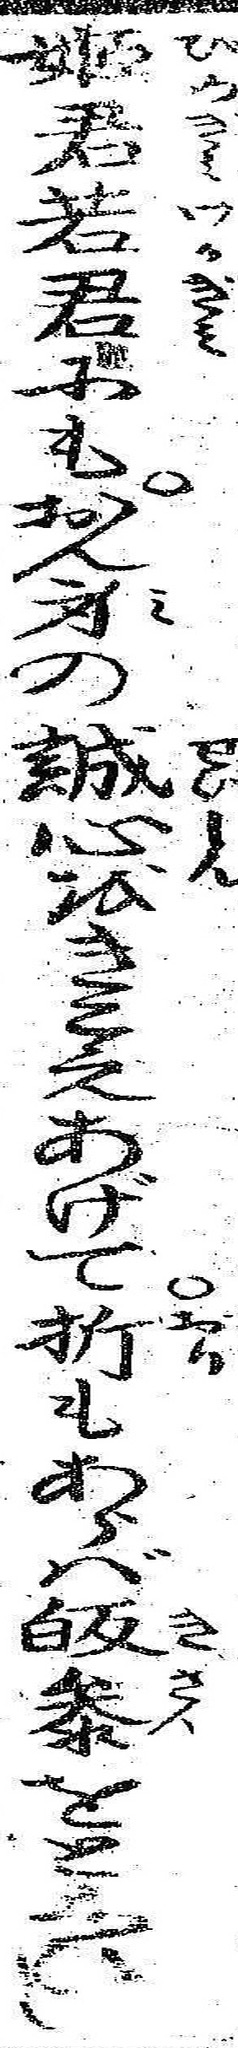姫君若君にも。おん身の誠心をきこえあげて。折もあらば帰参をと思ひし
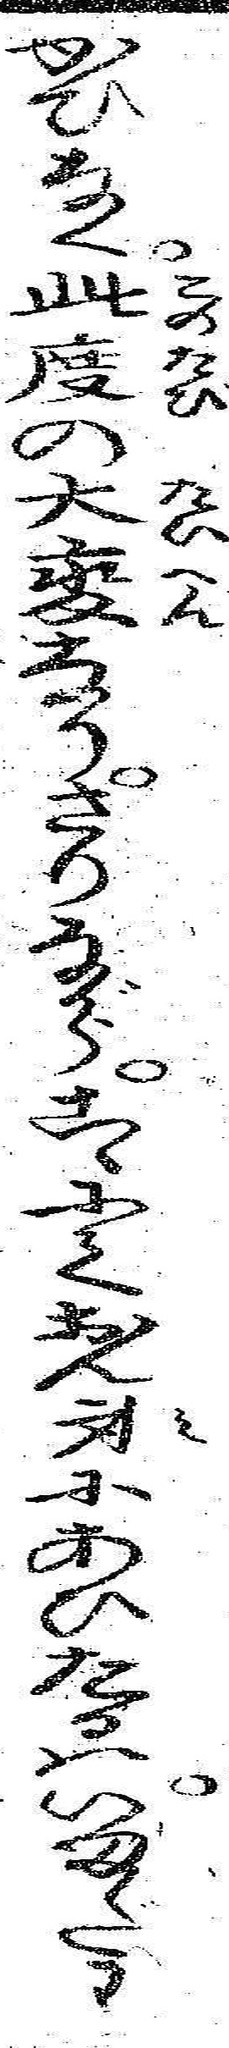かひなく。此度の大変なり。さりながら。こゝにておん身にあひたるは。いまだわ
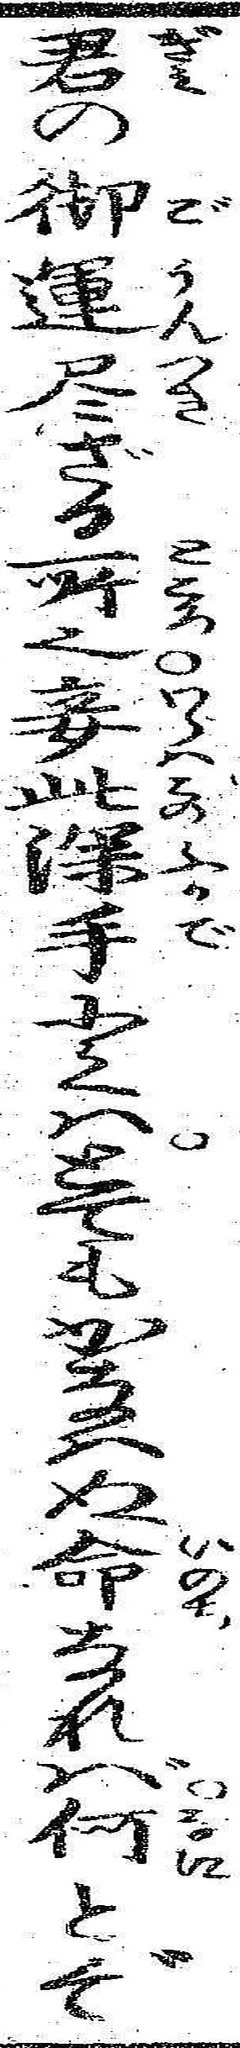君の御運尽ざる所也。妾此深手にては。とてもかなはぬ命なれば。何とぞ
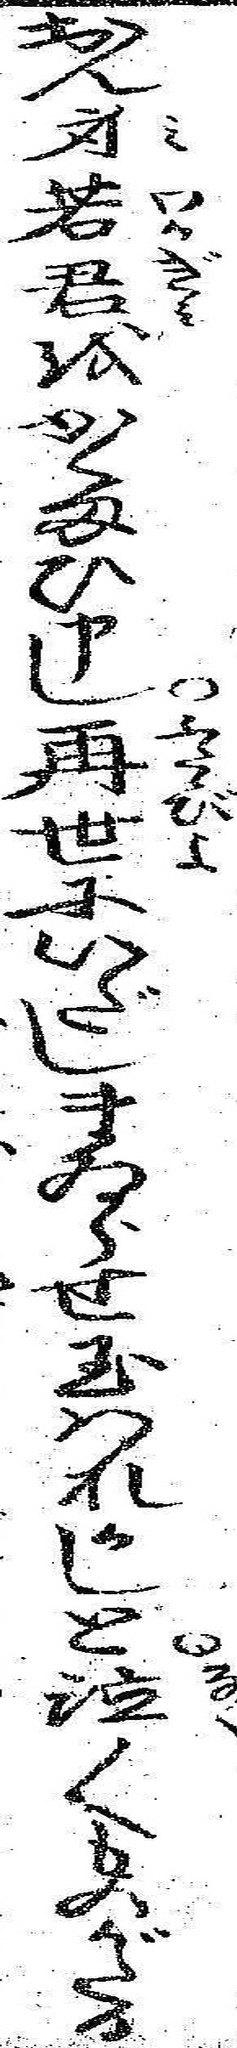おん身若君をかくまひ申し。再世にいだしまゐらせ玉はれかしと。泣々ものがたる
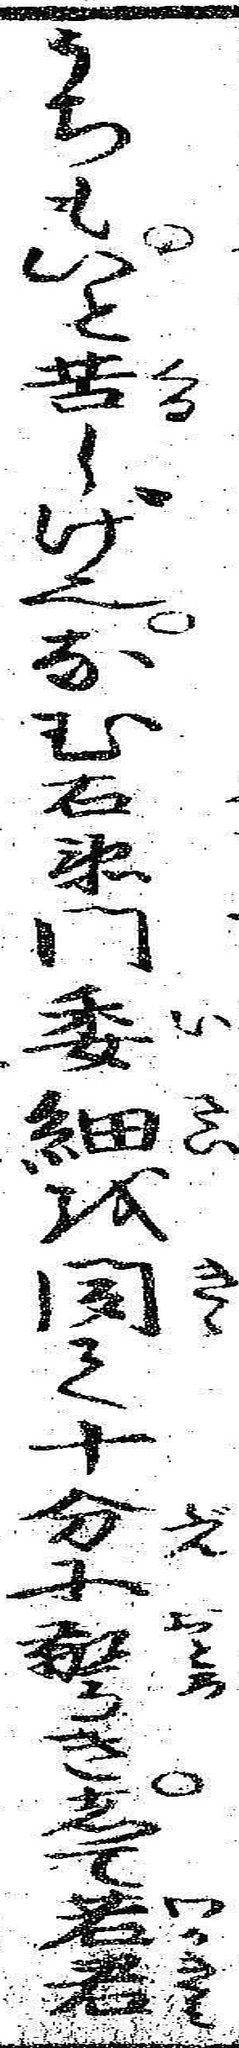うちも。いと苦しげ也。なむ右衛門委細を聞て十分に驚き。して若君
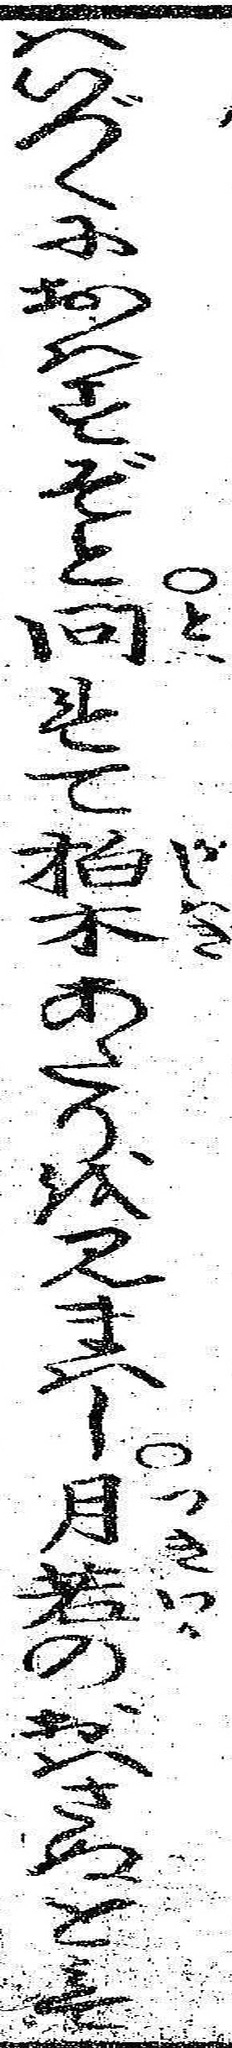はいづくにおはすぞと。問れて柏木あたりを見まはし。月若のおはさぬをみて
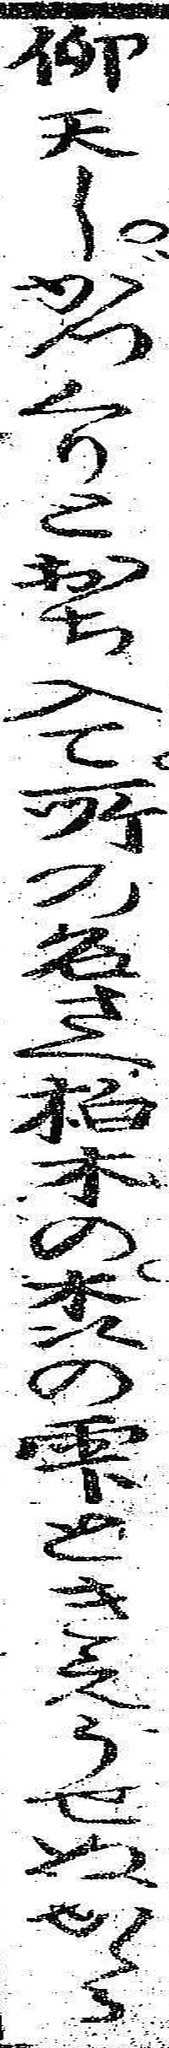仰天し。がつくりとおち入て。所の名さへ柏木の。森の雫ときえうせぬ。かゝる

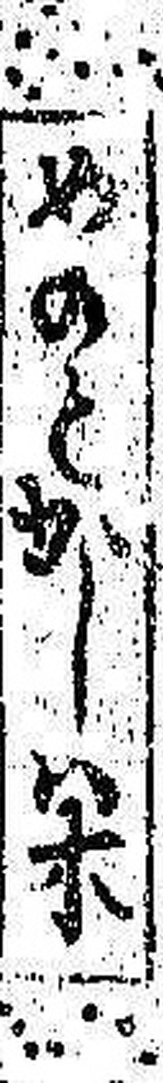めのとかしは木
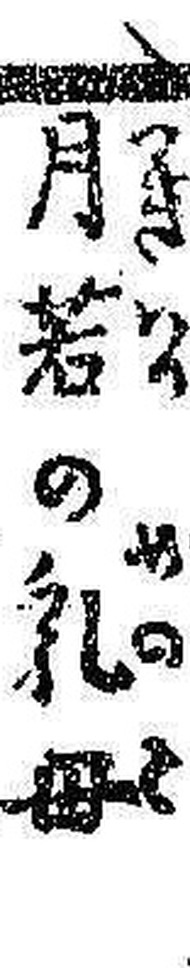月若の乳母
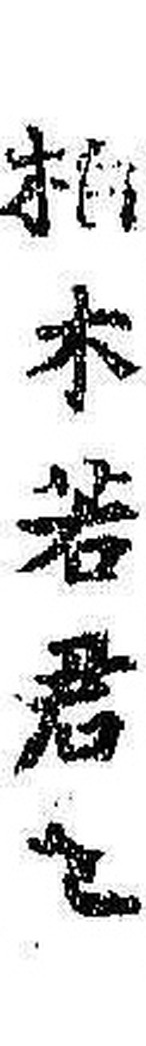柏木若君を
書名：昔話稲妻表紙
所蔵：国文学研究資料館
